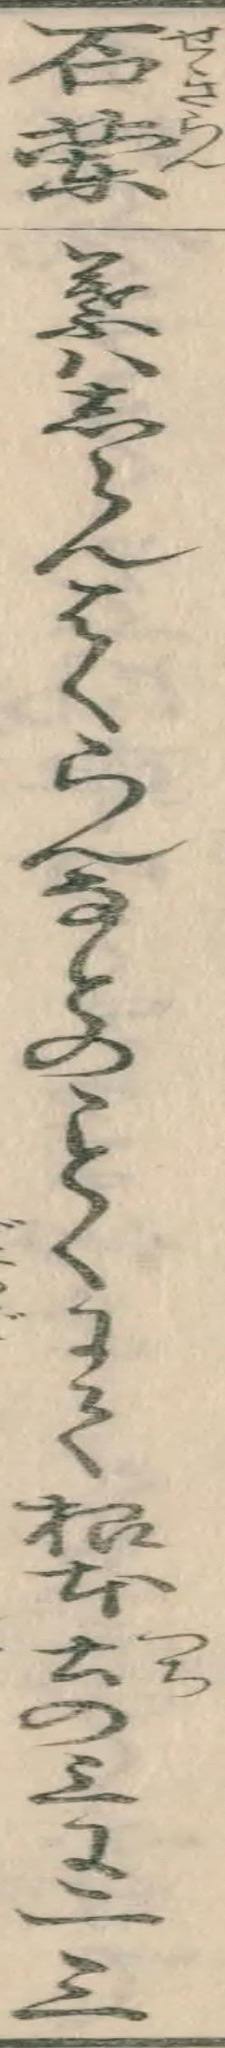[石蘭]葉はしらんはくらんなとのことくにて根本土の上に二三
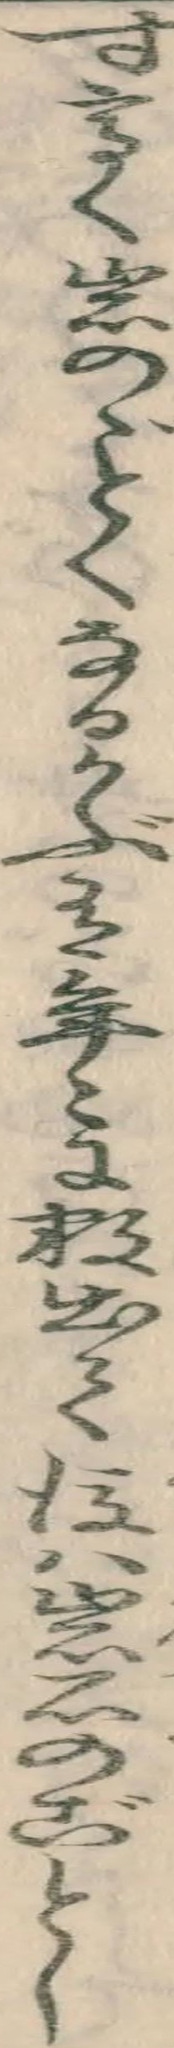寸高く岩のごとくなるかぶ有年々に数出て後は岩石のごとし
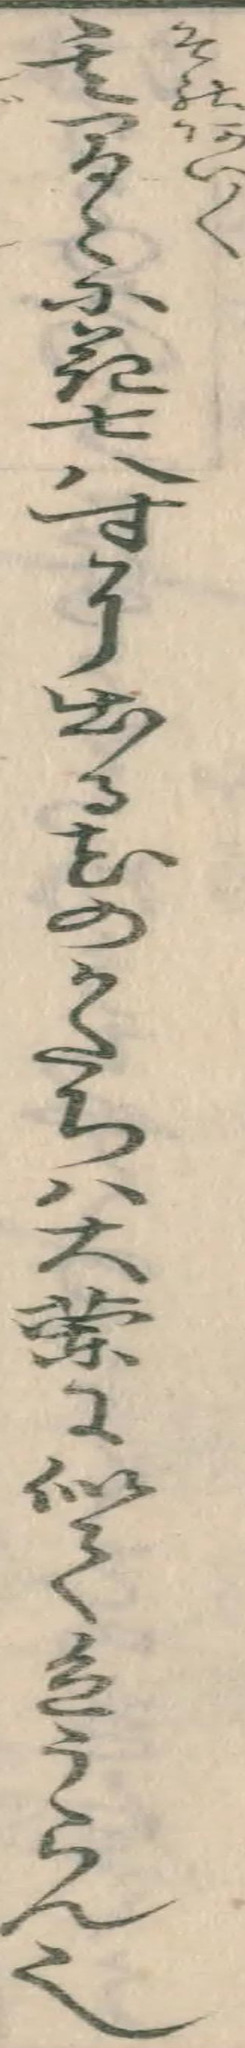其間々に花七八寸に出る花のかたちは大蘭に似て色うらん也
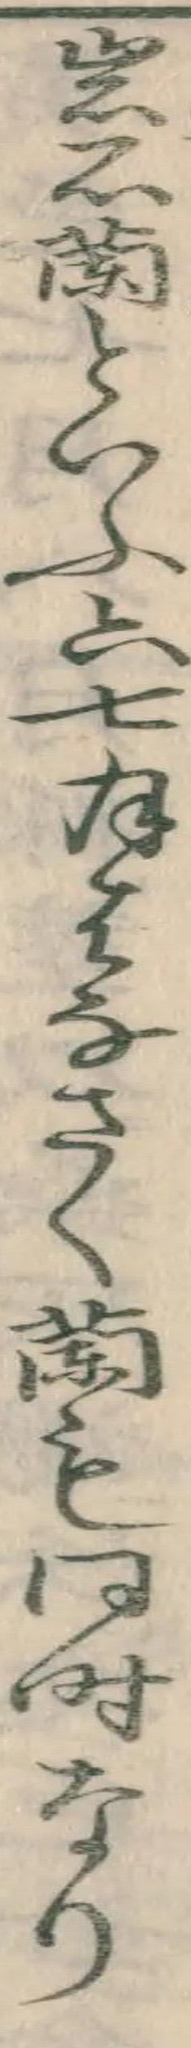岩石蘭といふ六七月はなさく蘭も同時なり
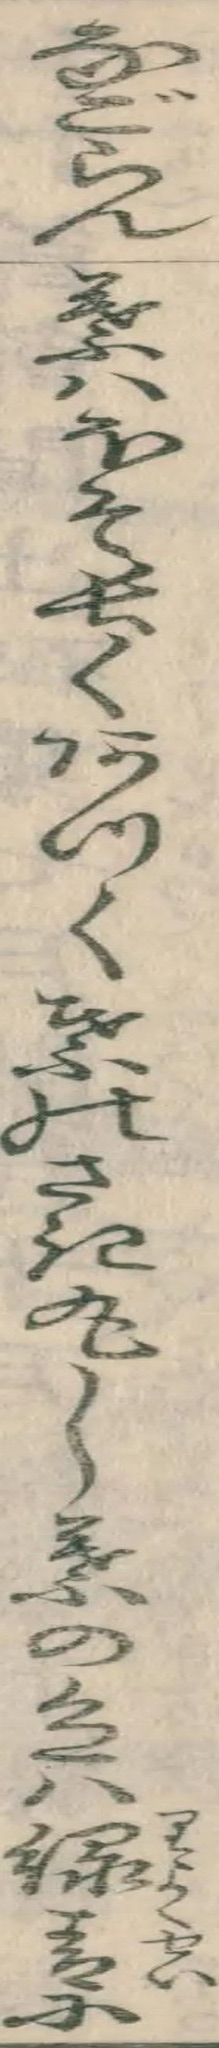[なごらん]葉はほそ長くあつく葉のさき丸し葉の色は緑青に
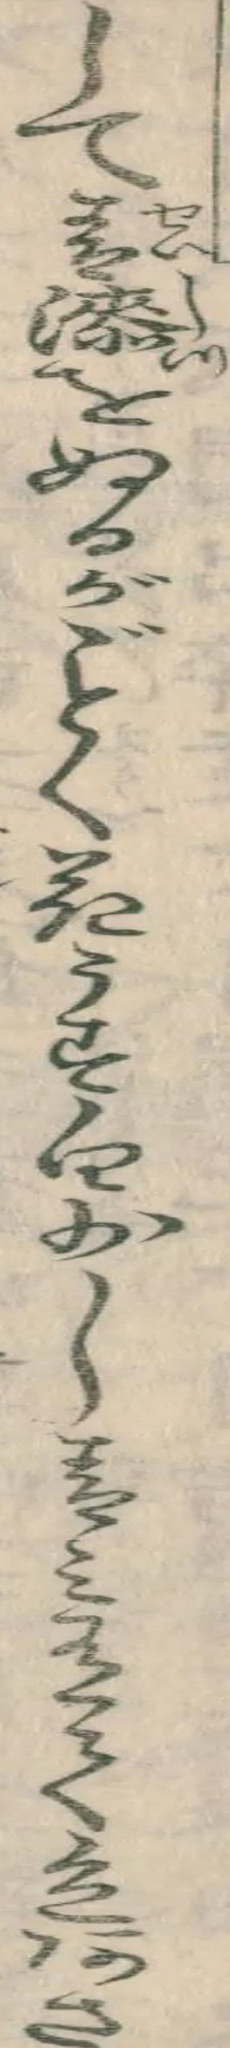して青漆をぬるがごとく花うす白少し青み有て色あさ
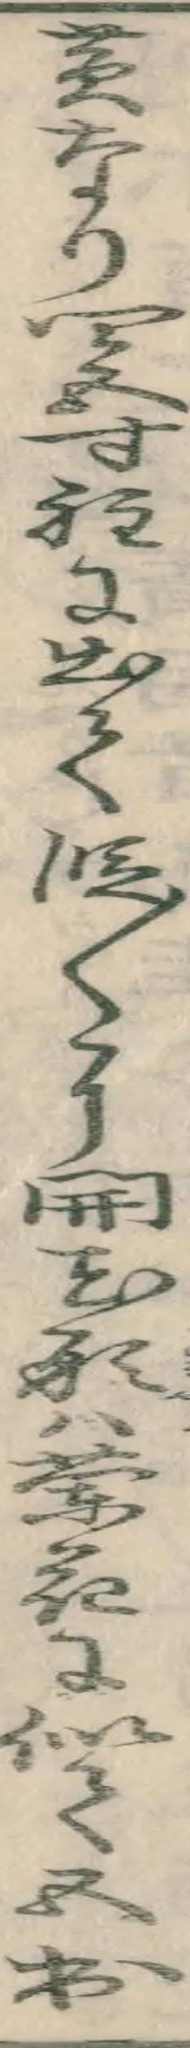黄なり四五寸程に出て段〳〵に開花形は蘭花に似て五出
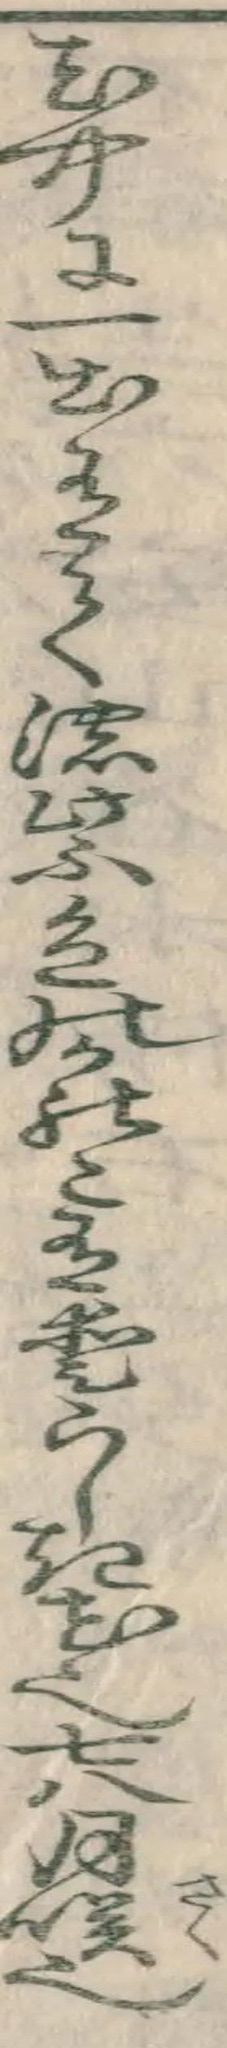花中に一出有て濃紫色のかのこ有愛らしき花也七八月咲也
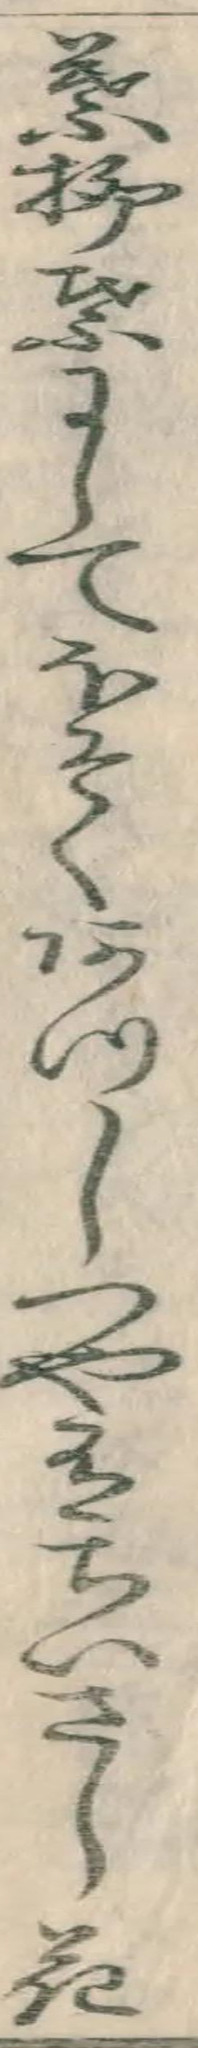葉柳葉にしてほそくあつしつや有ちいさし花
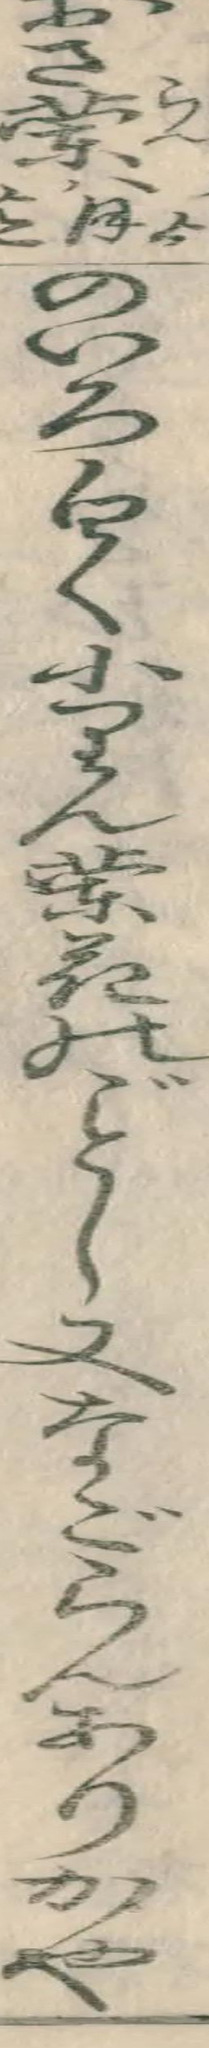のいろ白く小りん蘭花のごとし又なごらんありかや
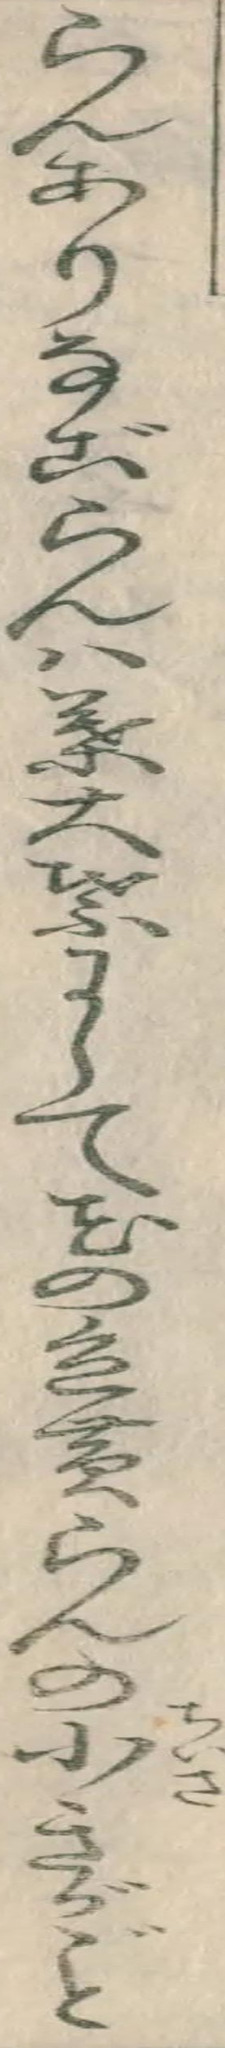らんありなごらんは葉大葉にして花の色黄らんの小きがごと
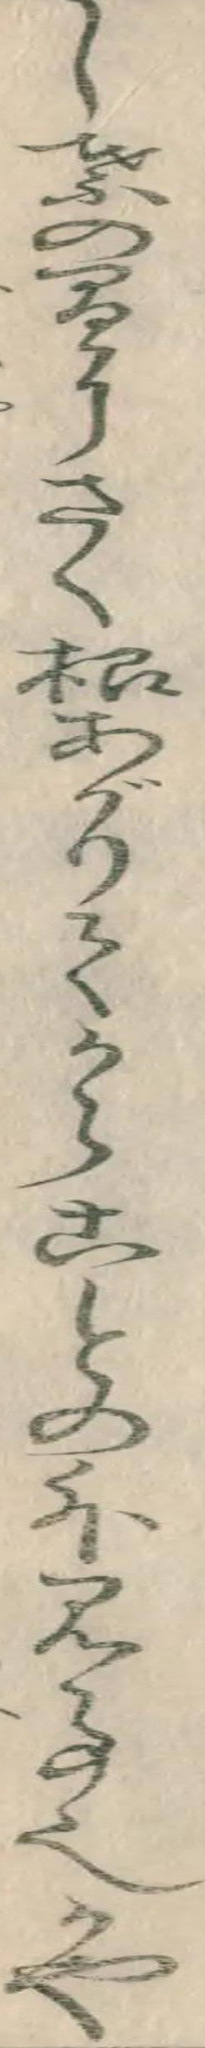し葉の間にさく根あがりてからことの外見事也かや
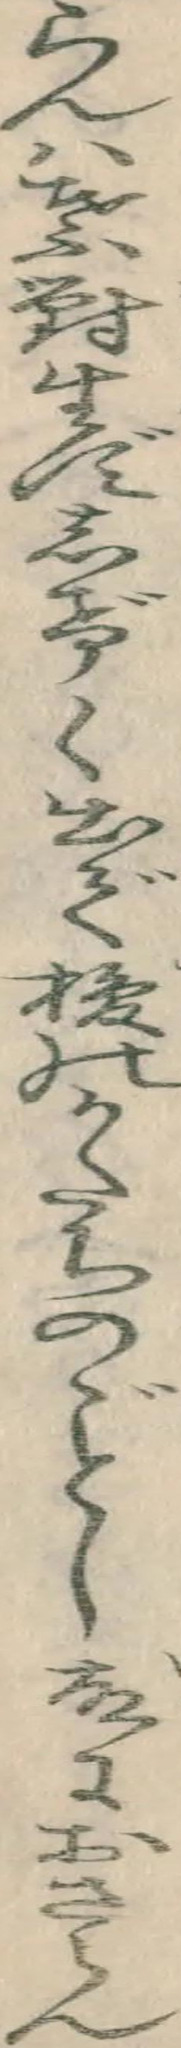らんは葉対生ずしげく出で梭のかたちのごとし故におさらん

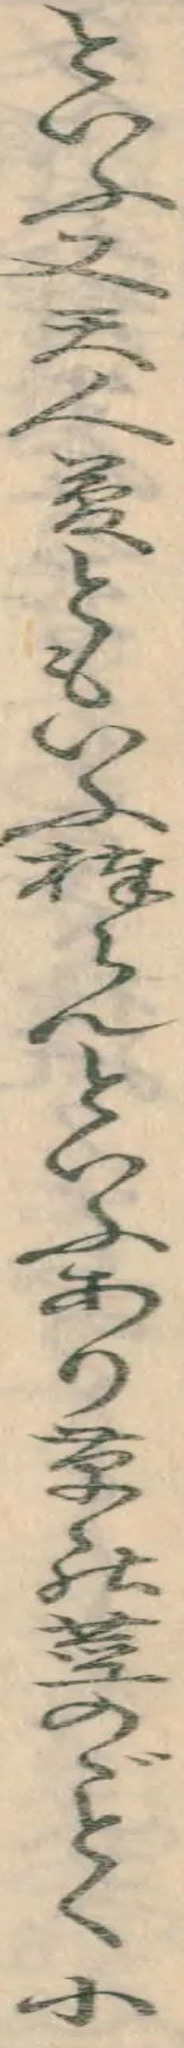といふ又天人夢ともいふ棒らんといふあり草の茎のごとく小
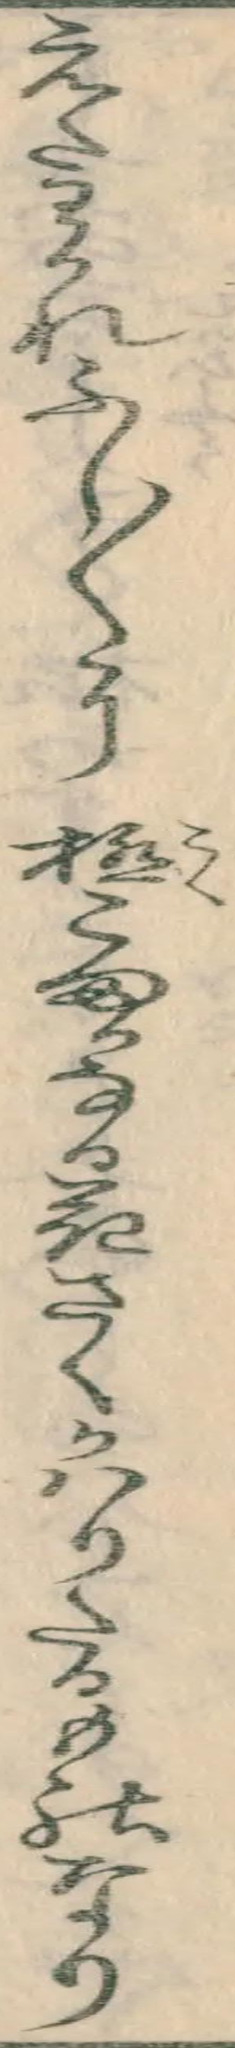えたわかれふし〳〵に極こまかなる花さくかはりたるものなり
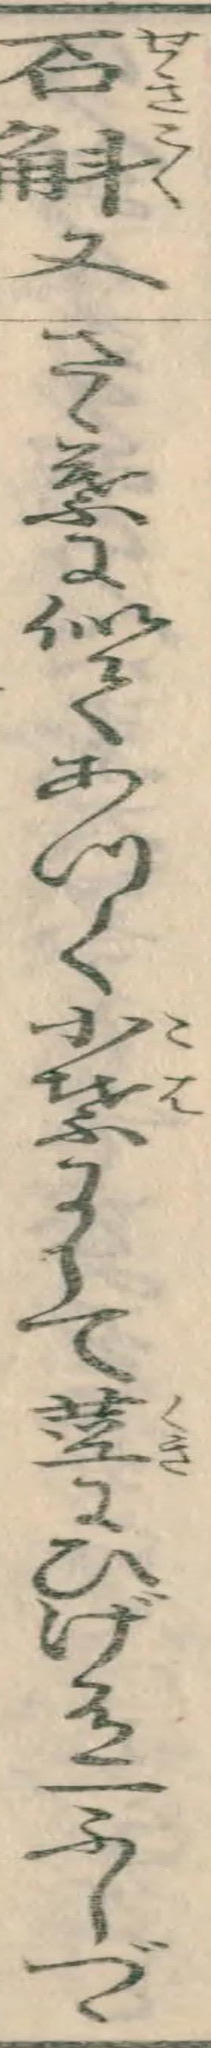さゝ葉に似てあつく小葉にして茎にひげ有一ふしづゝ
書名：畫本野山草. [1]
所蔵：国立国会図書館 National Diet Library, JAPAN
